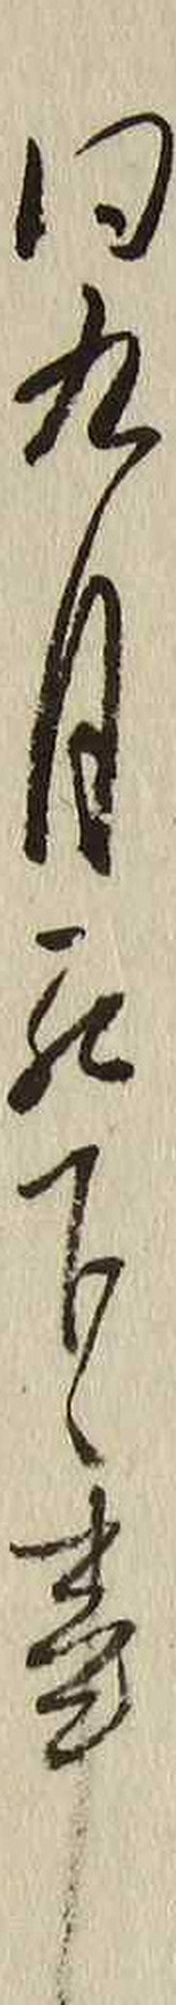同九月罷下候事
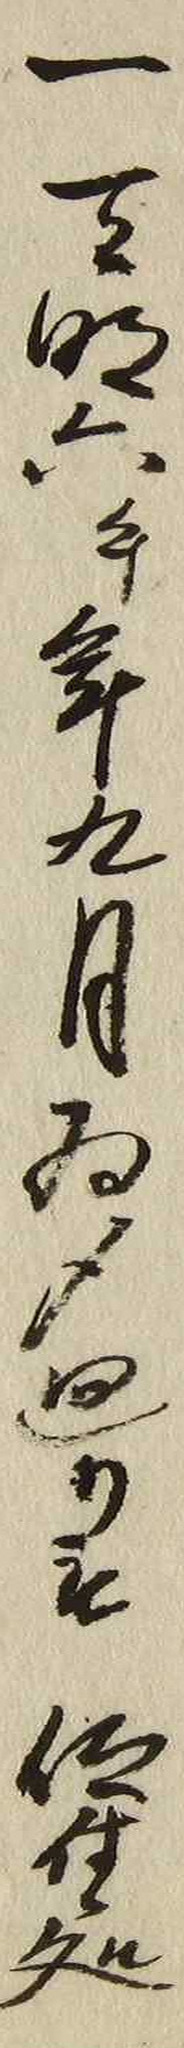一天明六午年九月為〆廻り被仰付候処
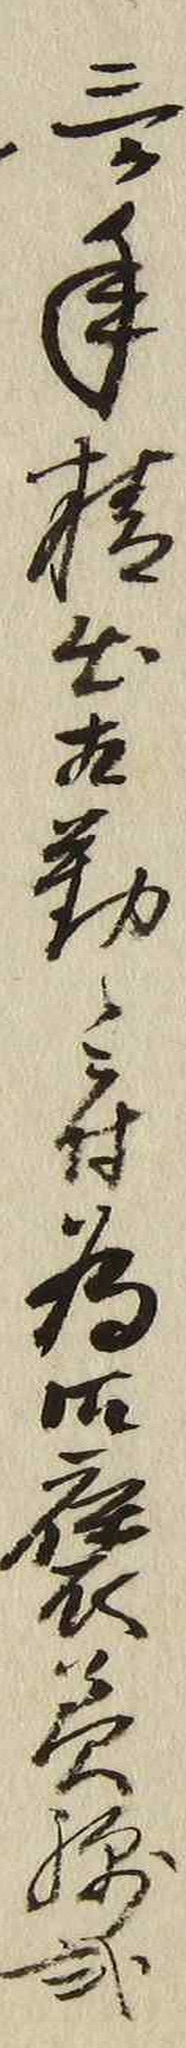三ケ年精出相勤候ニ付為御褒美綿弐
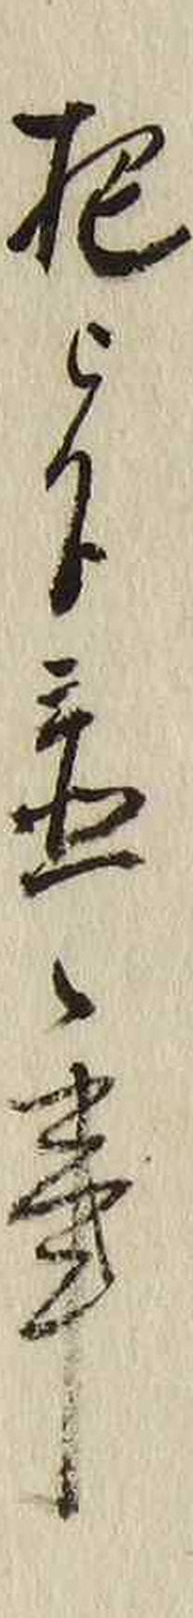把被下置候事
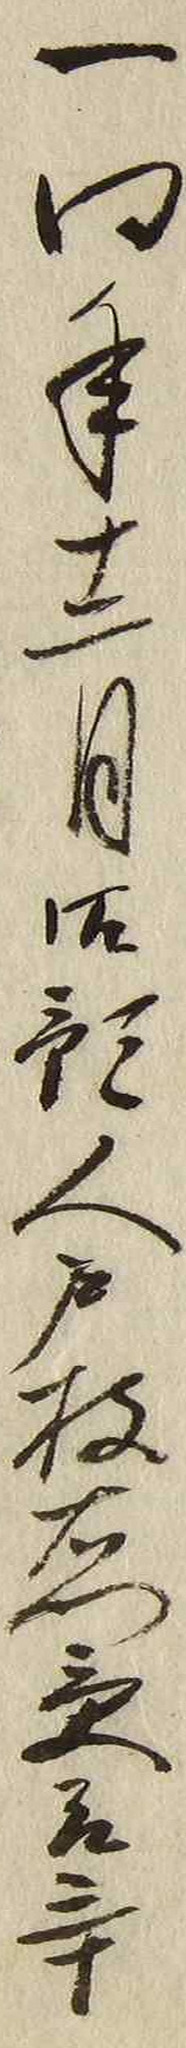一同年十二月御預人戸枝右門受取三十
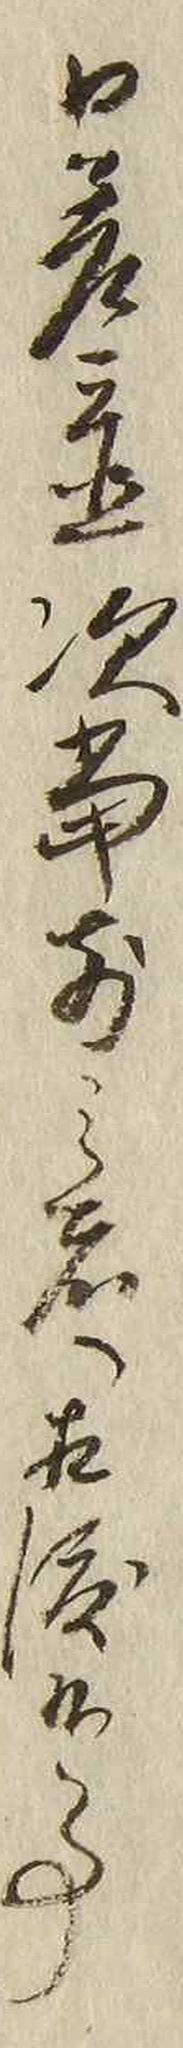日差置次当前之者へ相渡候事

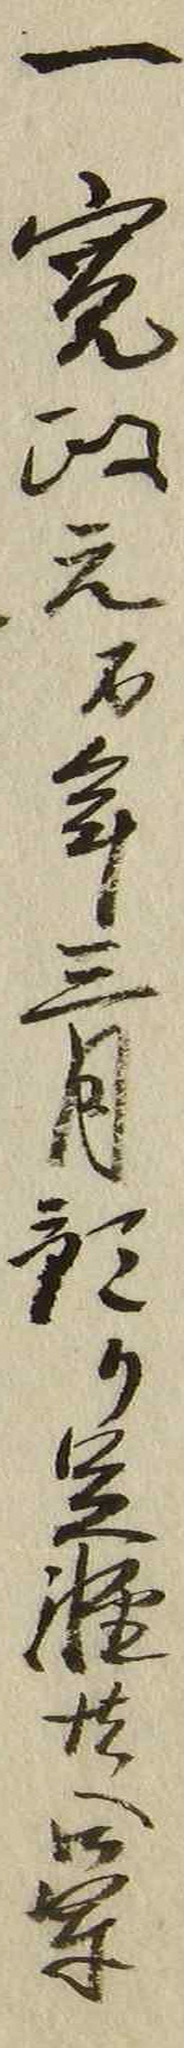一寛政元酉年三月預り足軽共へ御軍
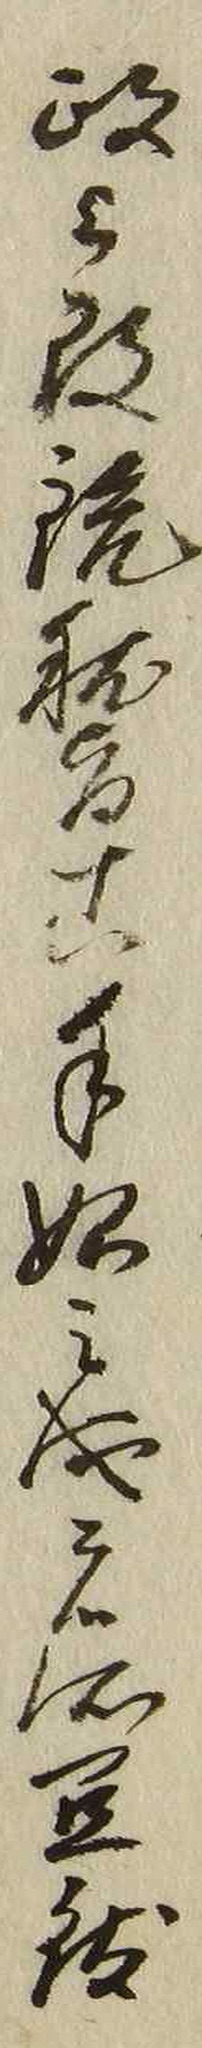政与改銃稽古手始之儀ニ候所宜致
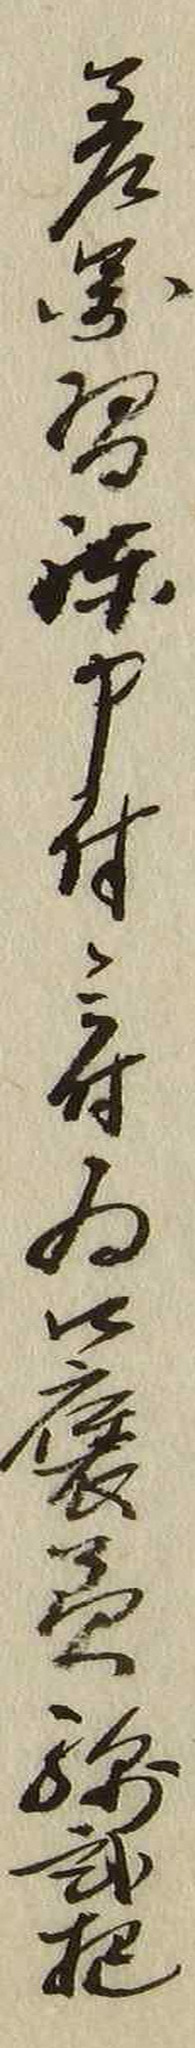差図習練申付候ニ付為御褒美綿弐杷
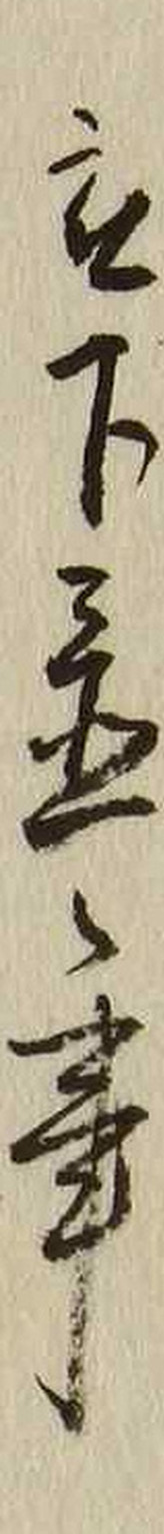被下置候事
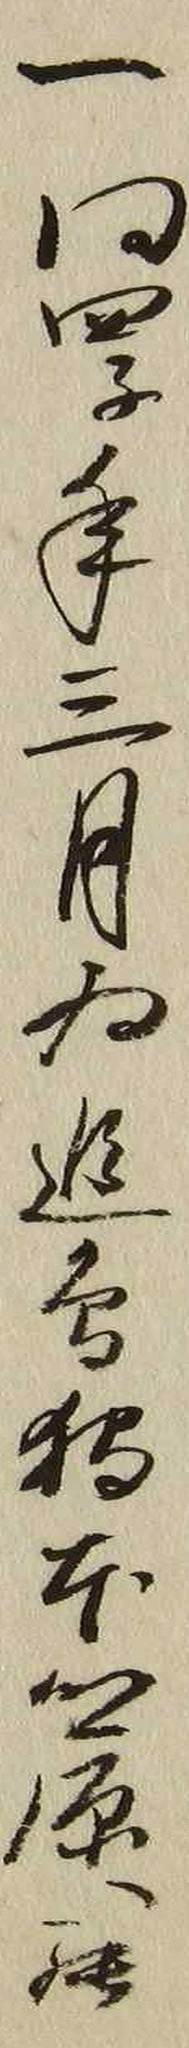一同四子年三月為追鳥狩本郷原へ罷
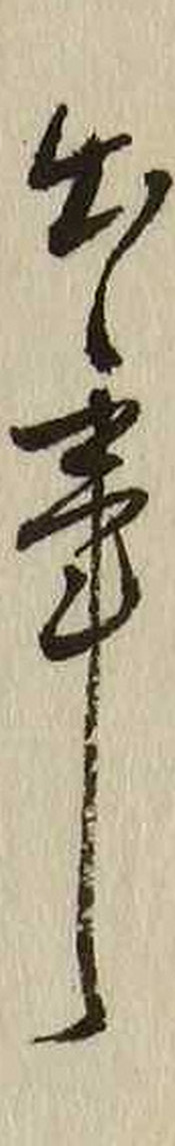出候事
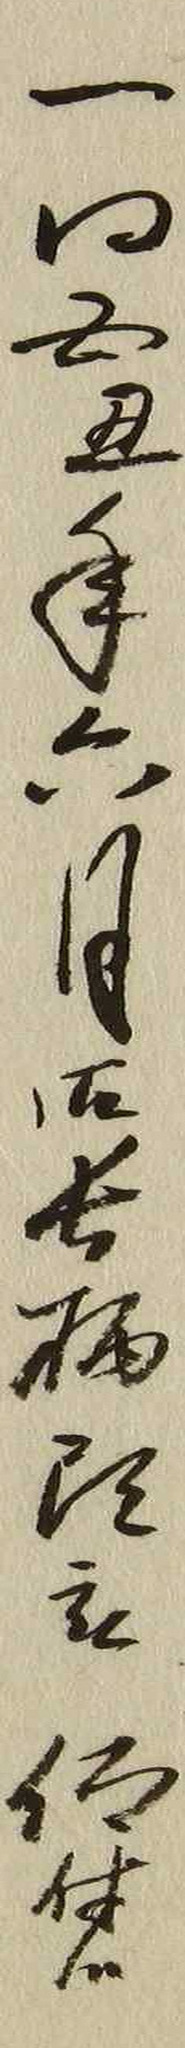一同五丑年六月御長柄頭被仰付候
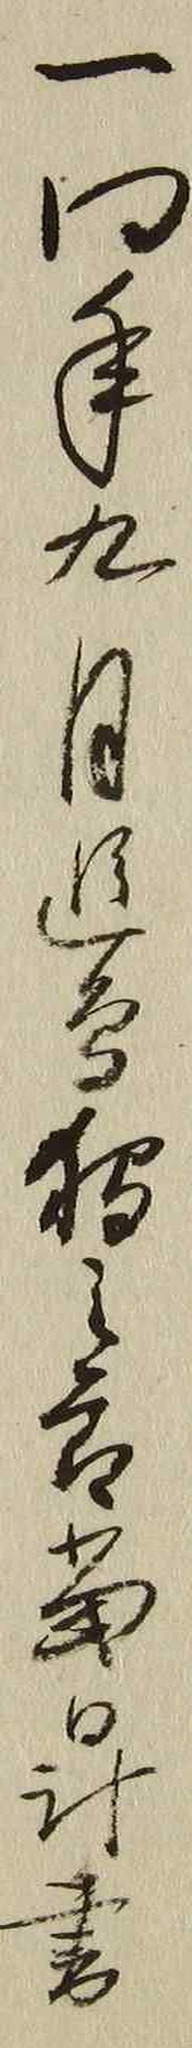一同年九月追鳥狩之節当日計書
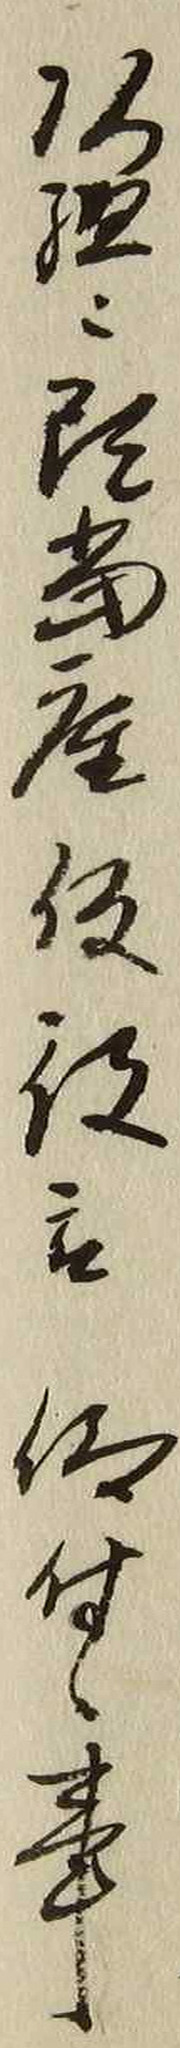頭組ニ頭当座仮役被仰付候事
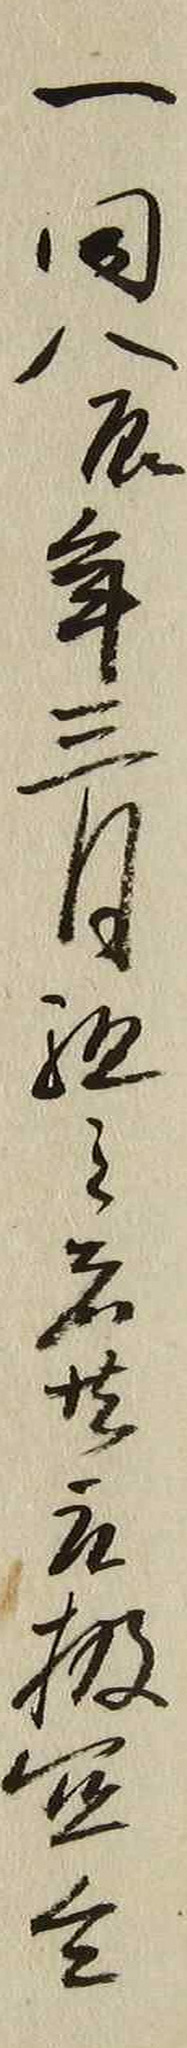一同八辰年三月組之者共取扱宜令
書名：諸士系譜　巻之356　す之部6
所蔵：会津若松市立会津図書館
